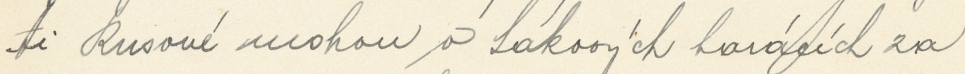ti Rusové mohou v takových barácích za
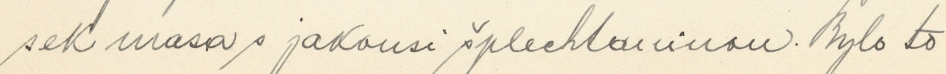sek masa s jakousi šplechtaninou. Bylo to
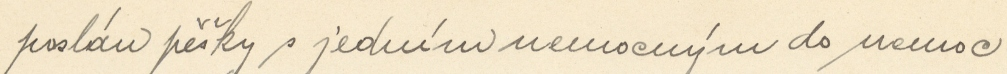poslán pěšky s jedním nemocným do nemoc-
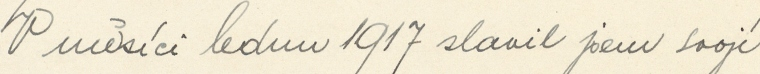V měsíci lednu 1917 slavil jsem svojí
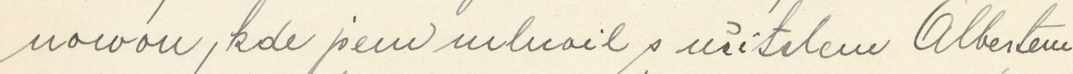nowou, kde jsem mluvil s učitelem Albertem
